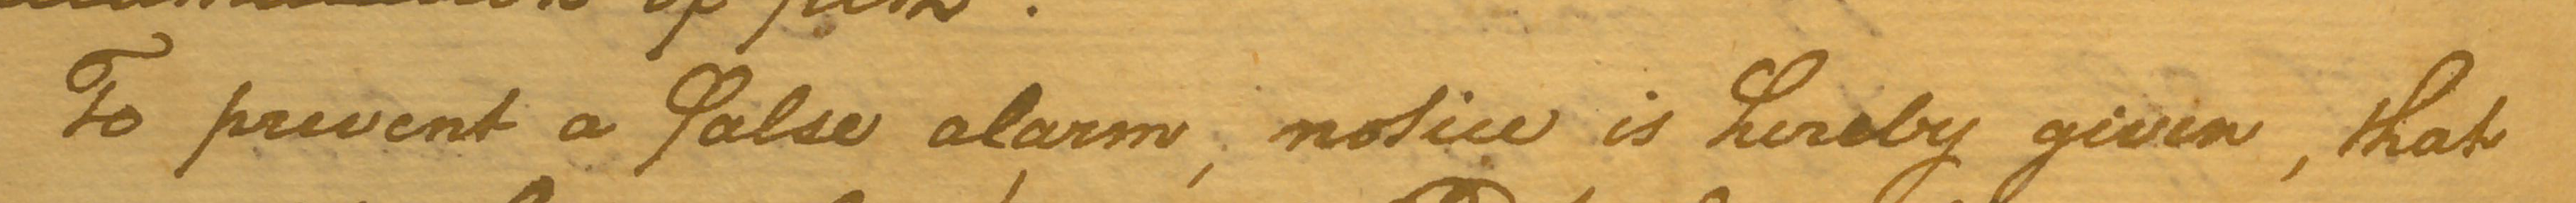To prevent a false alarm, notice is hereby given, that
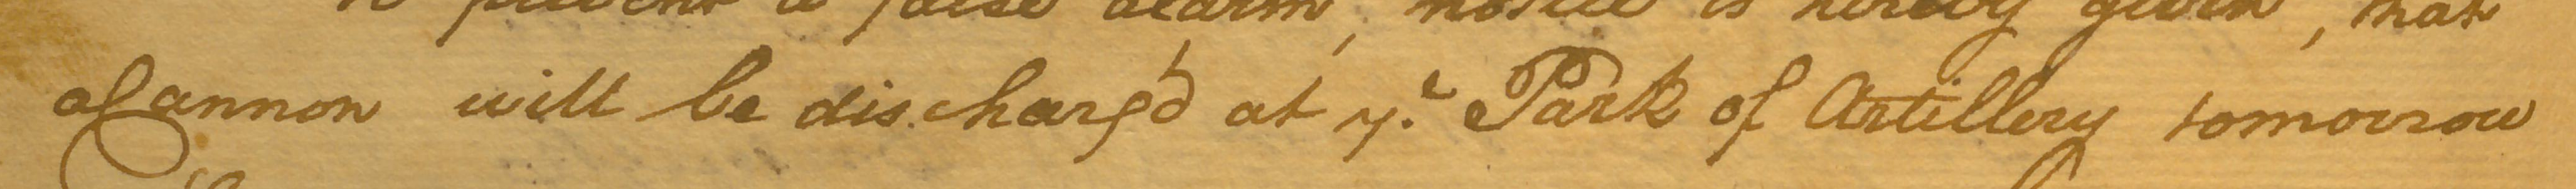a Cannon will be discharg'd at y^e. Park of Artillery tomorrow
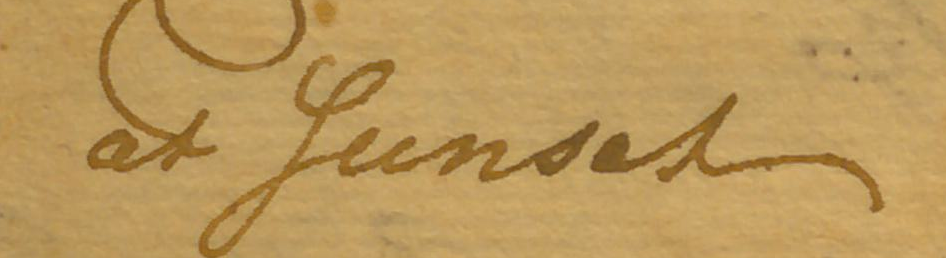at sunset
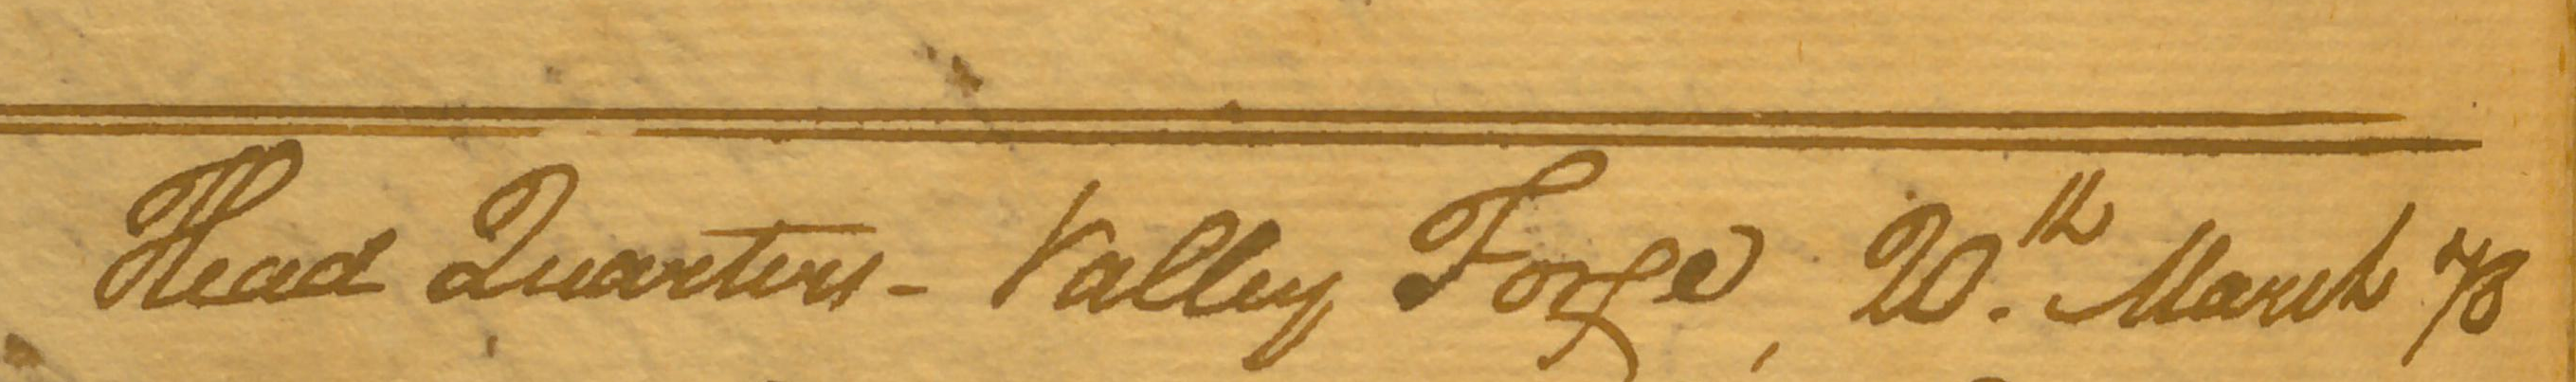Head Quarters- Valley Forge 20^th. March 78
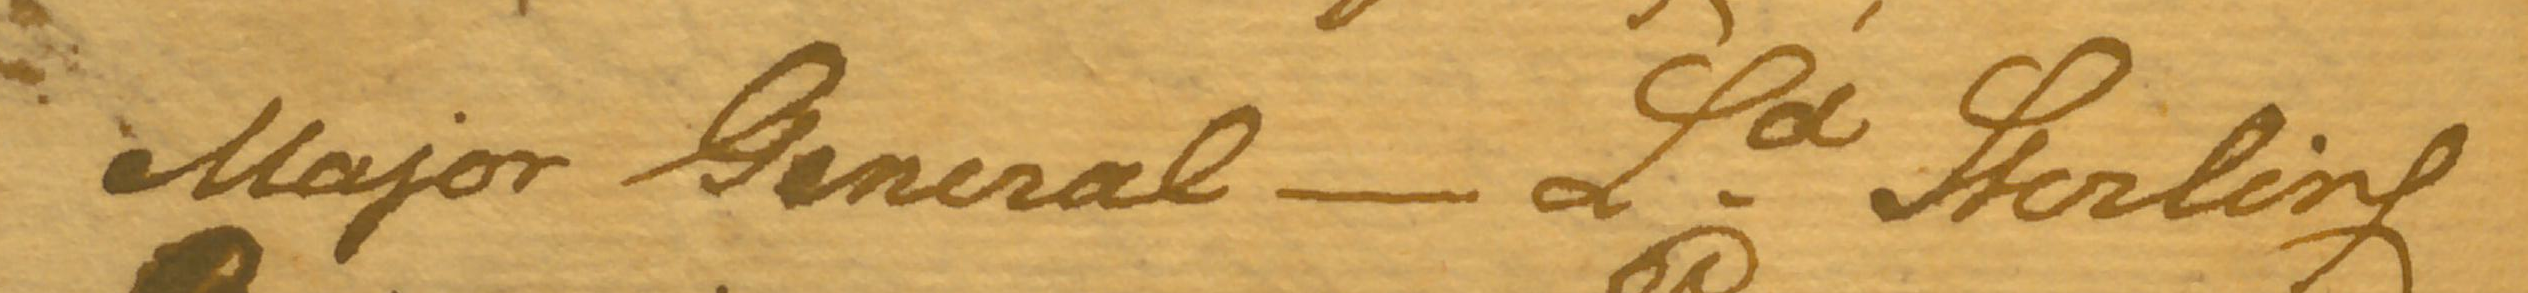Major General- L^d. Sterling
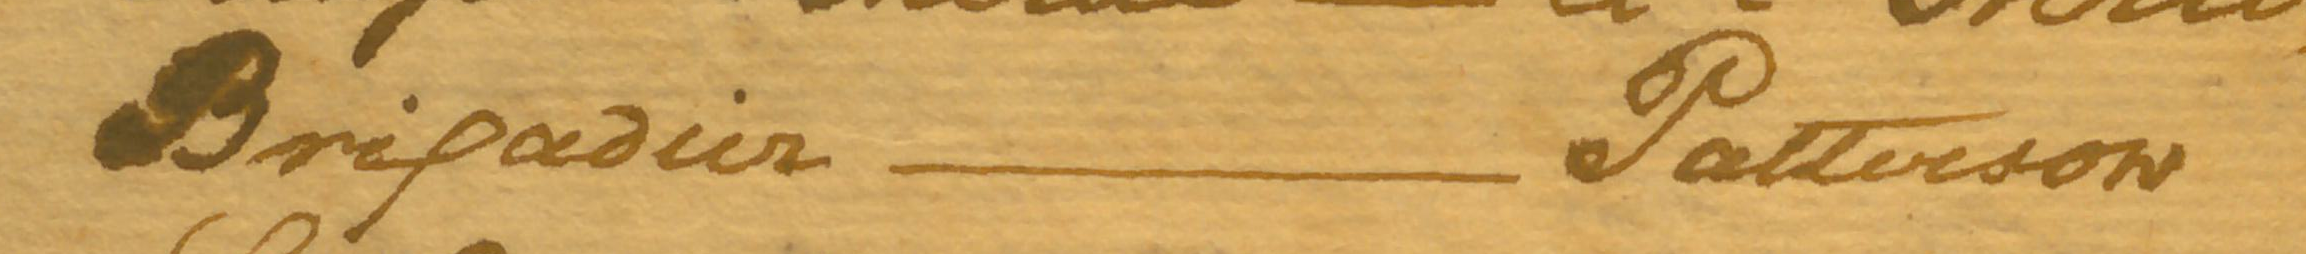Brigadier- Patterson
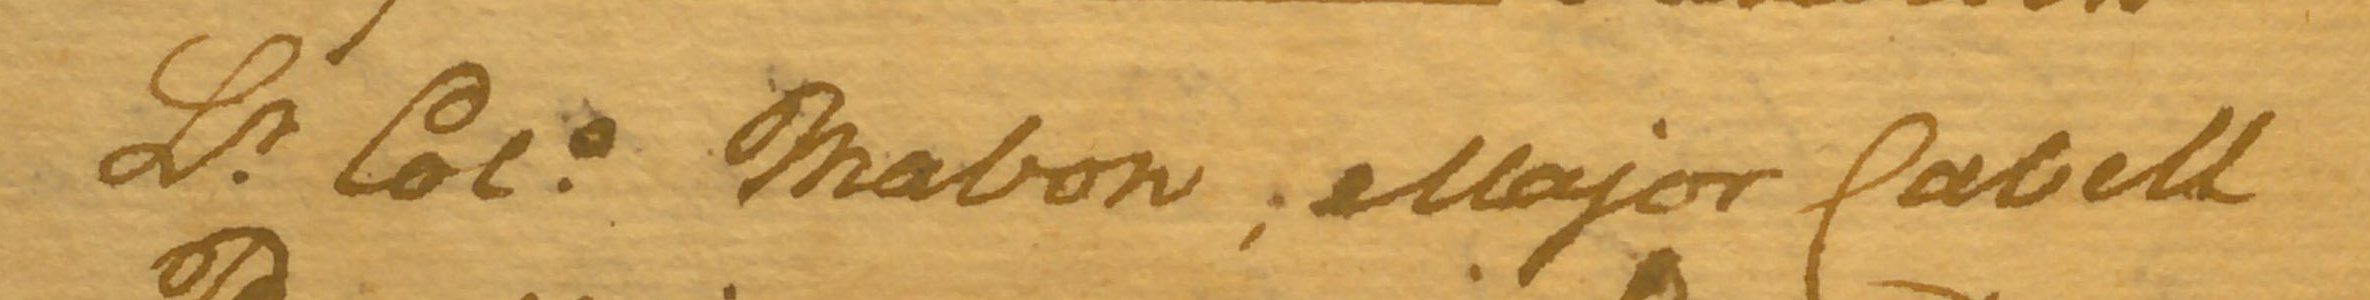L^t. Col^o. Mabon, Major Cabell
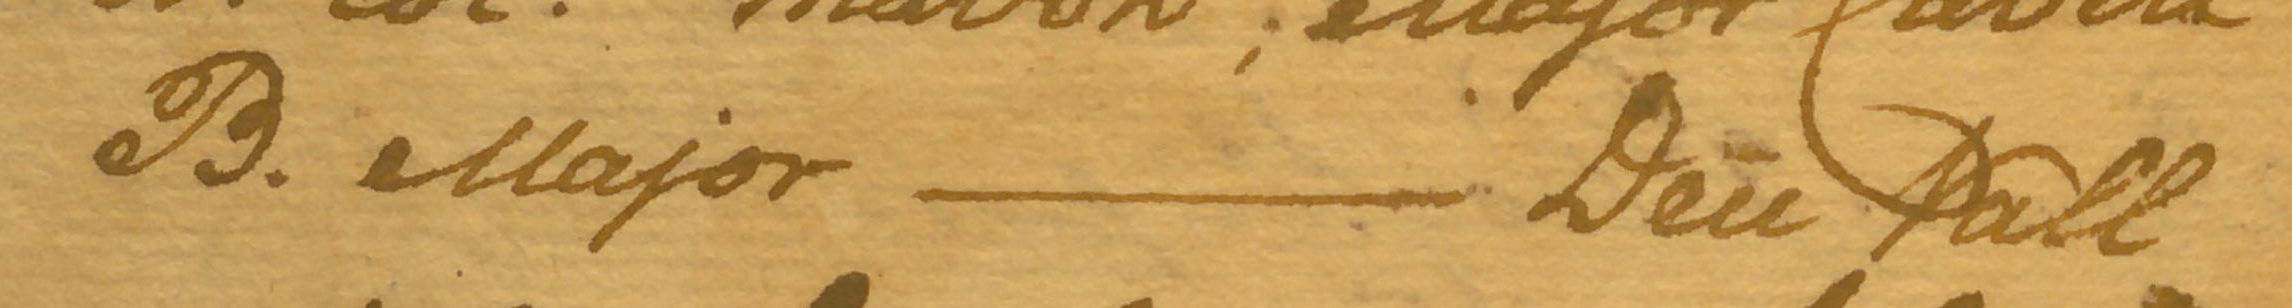B. Major Deu Vall
